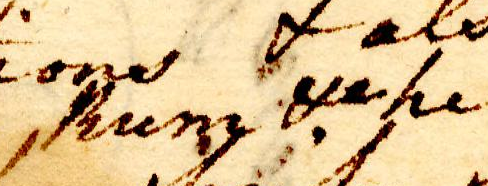Rum &c. he
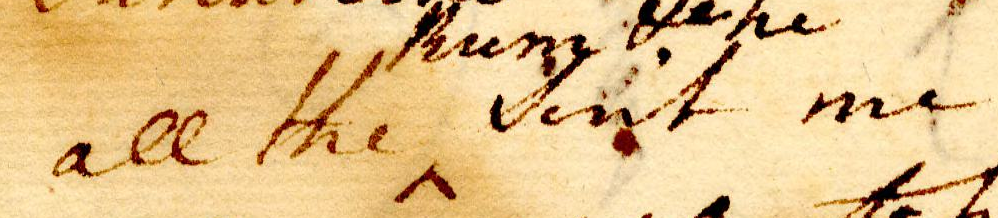all the ^ sent me
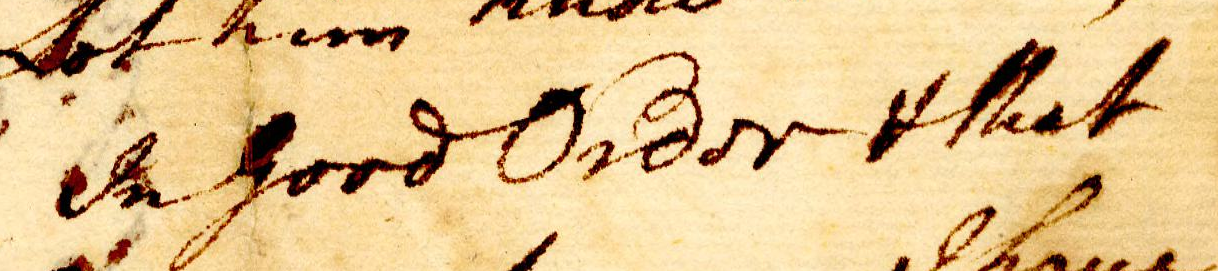In good Order & that
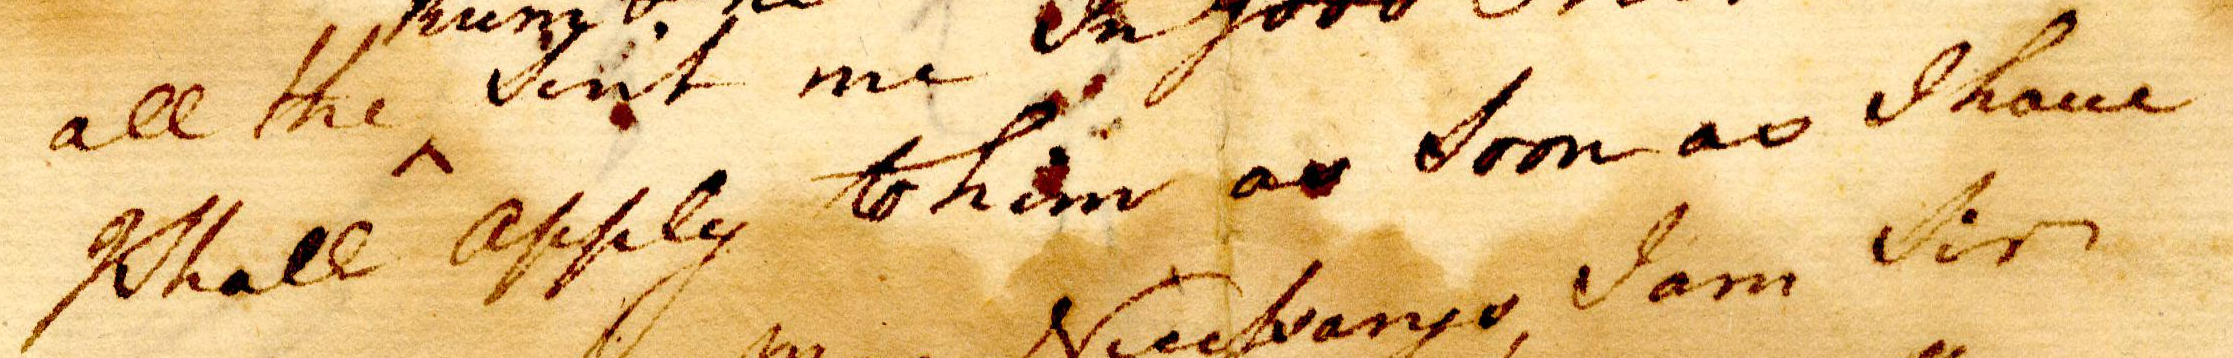I shall apply to him as soon as I have
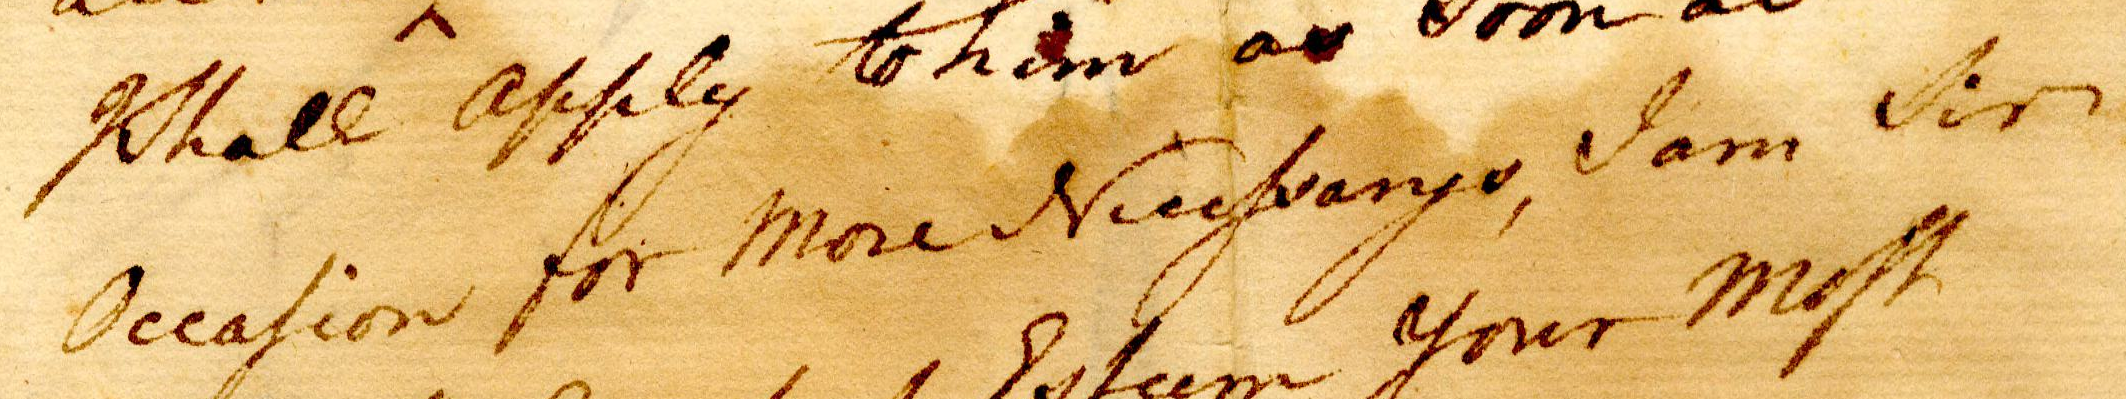Occasion for more Necessarys, I am sir
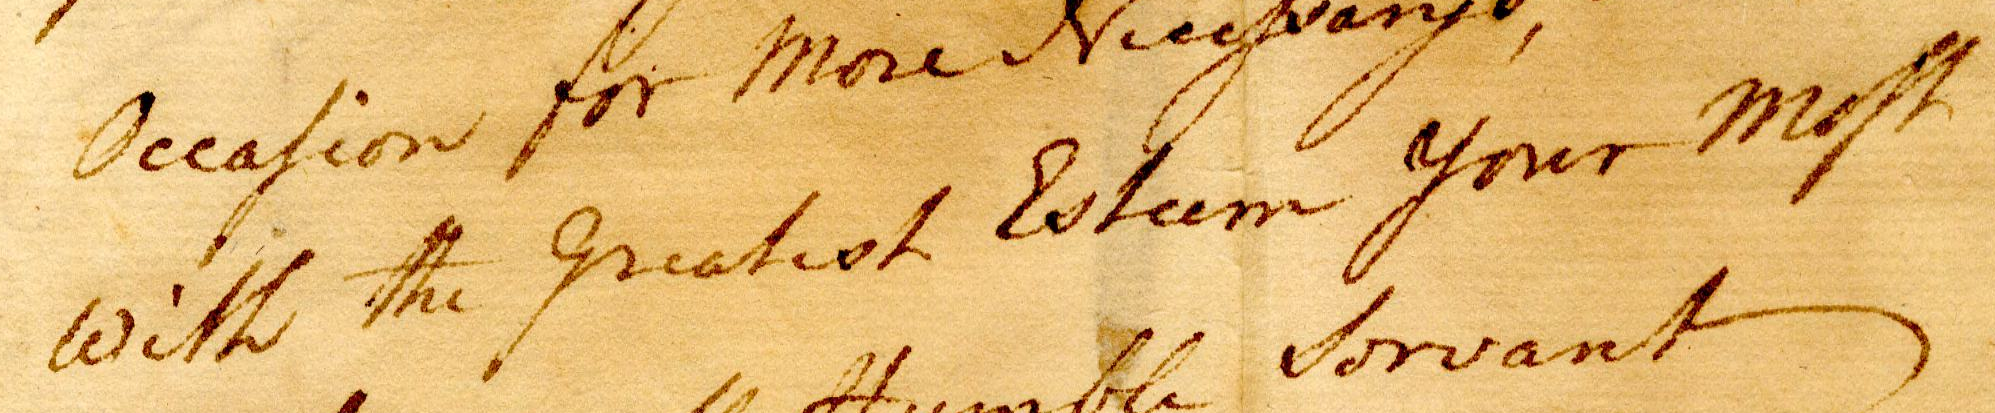with the greatest Esteem your most
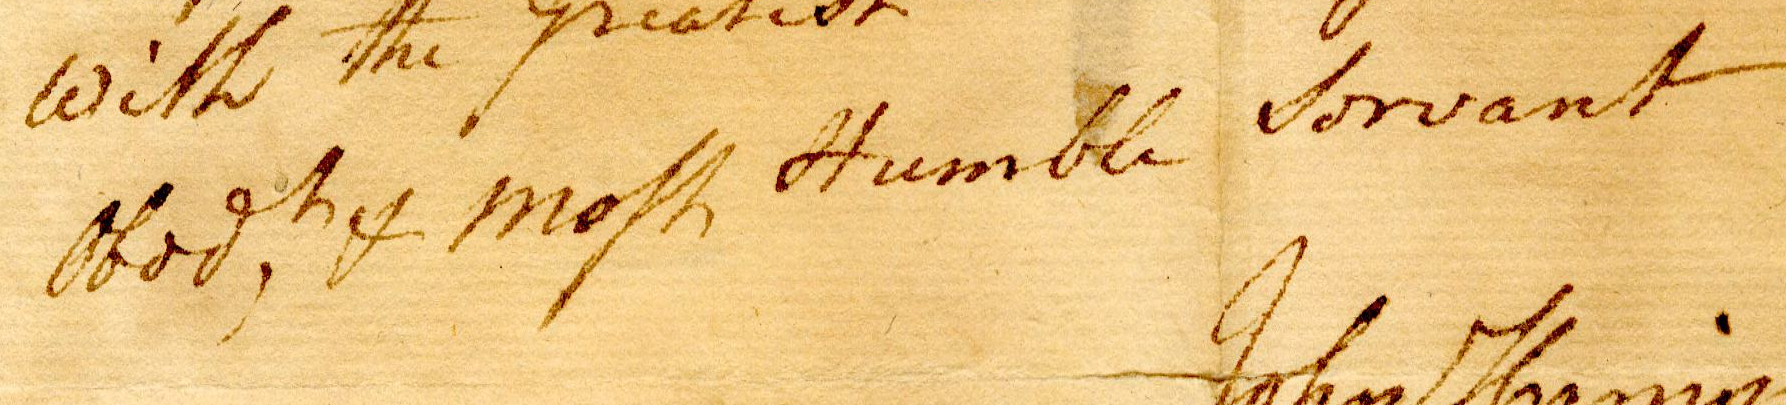Obed^t, & most Humble servant
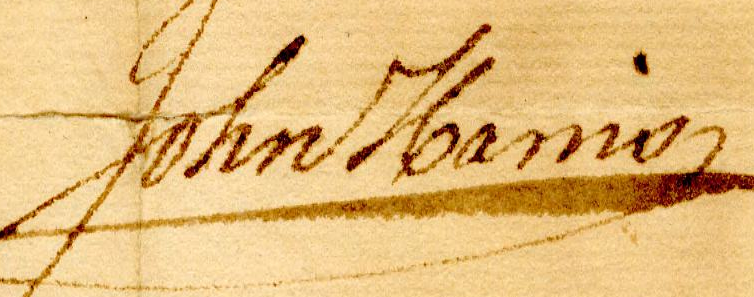John Hains
